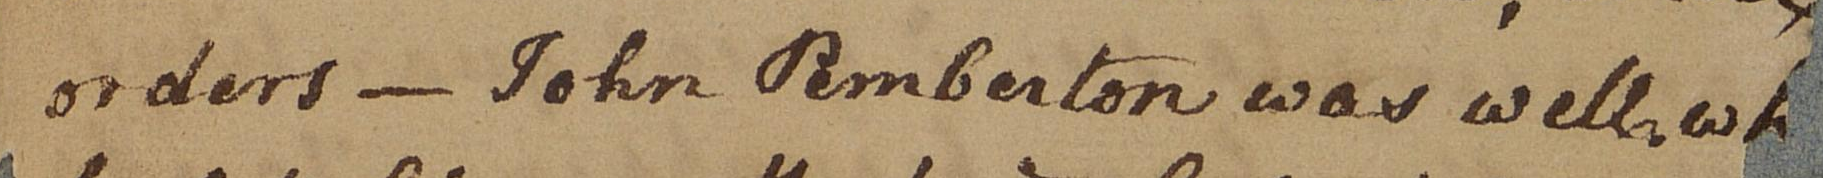orders- John Pemberton was well, w[h]
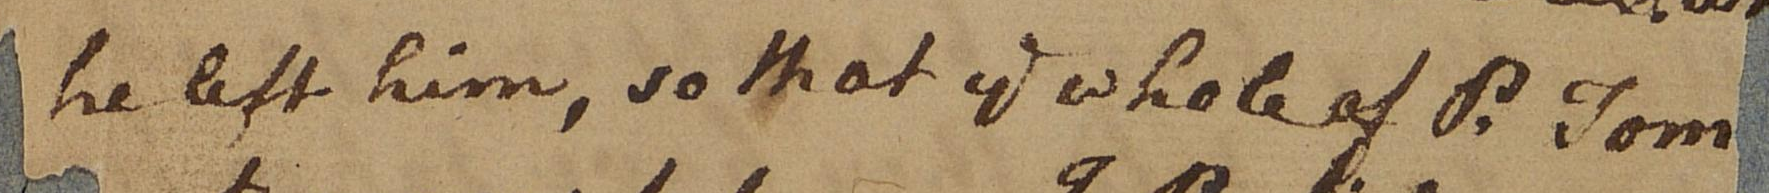he left him, so that y^e whole of P. Tom
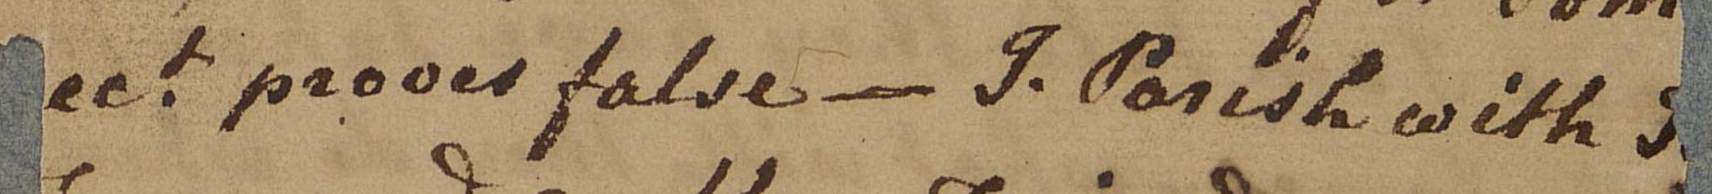cc^t. proves false- I. Parish with I
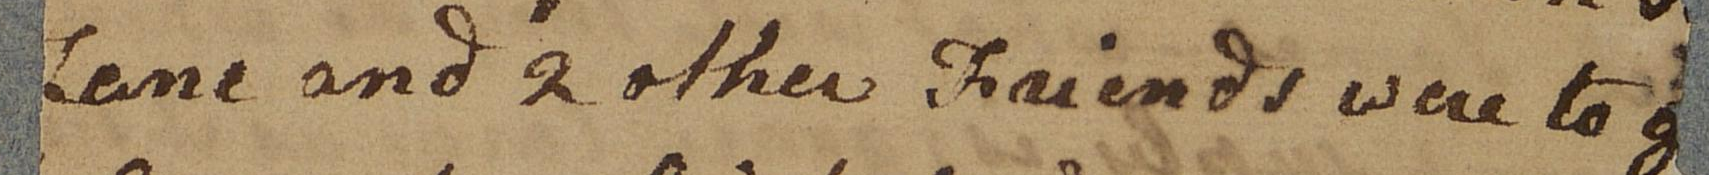Zane and 2 other Friends were to g
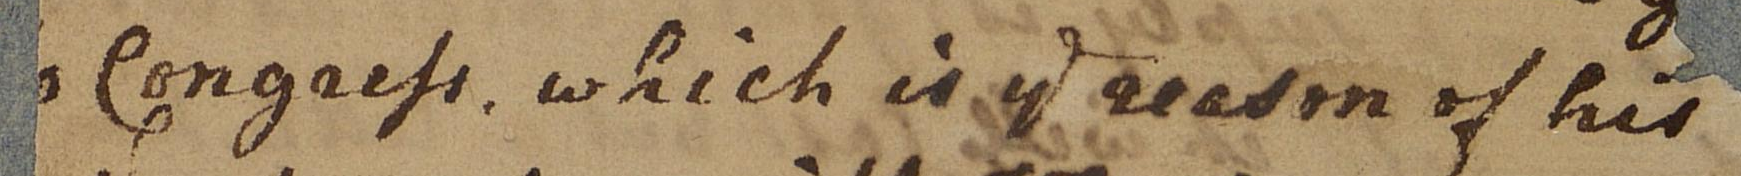o Congress, which is y^e reason of his
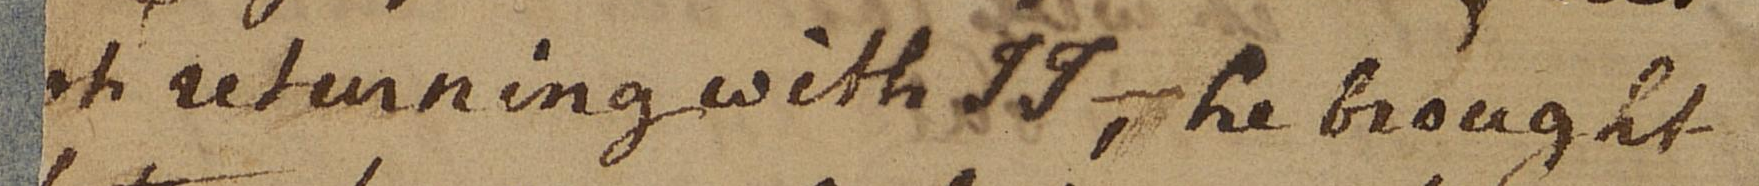t returning with II he brought
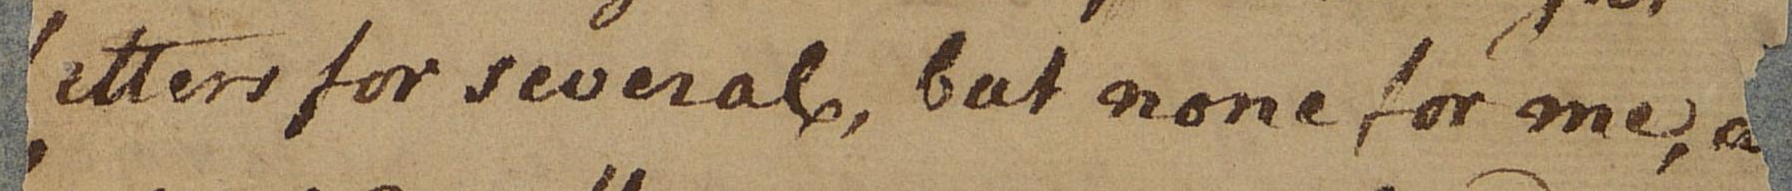[L]etters for several, but none for me, a
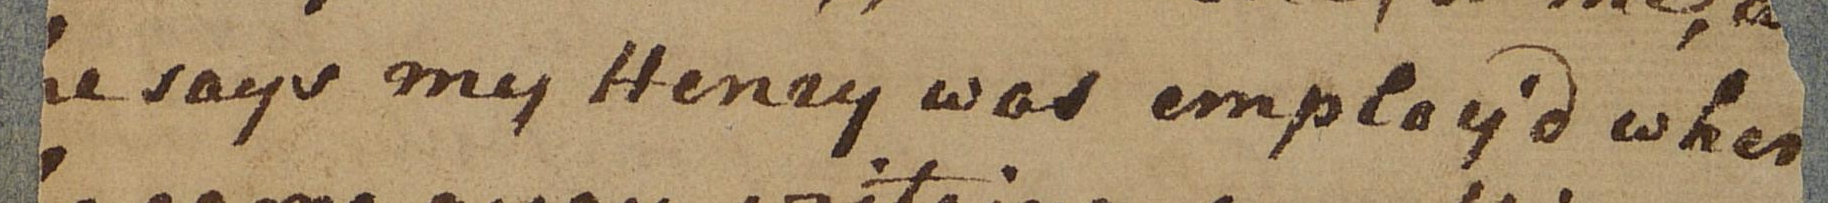he says my Henry was employ'd when
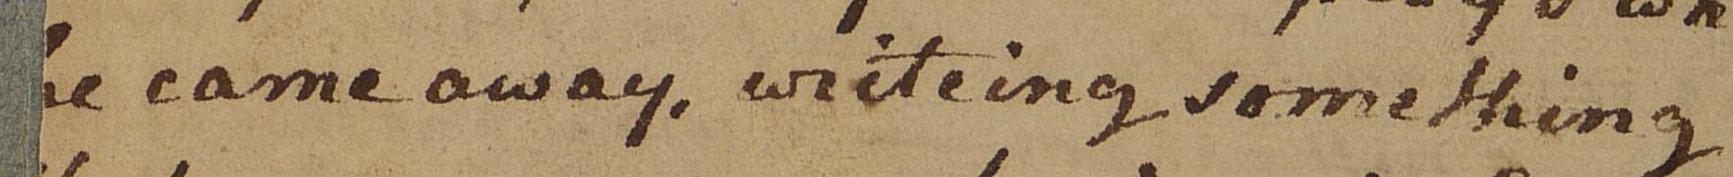he came away, writeing some thing
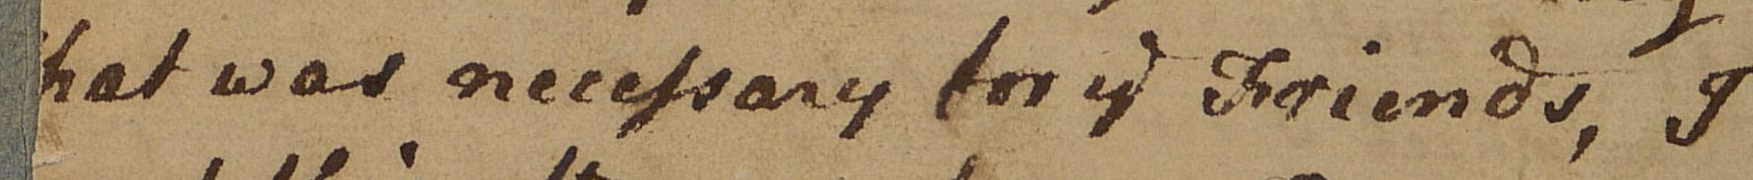hat was necessary for y^e Friends, I
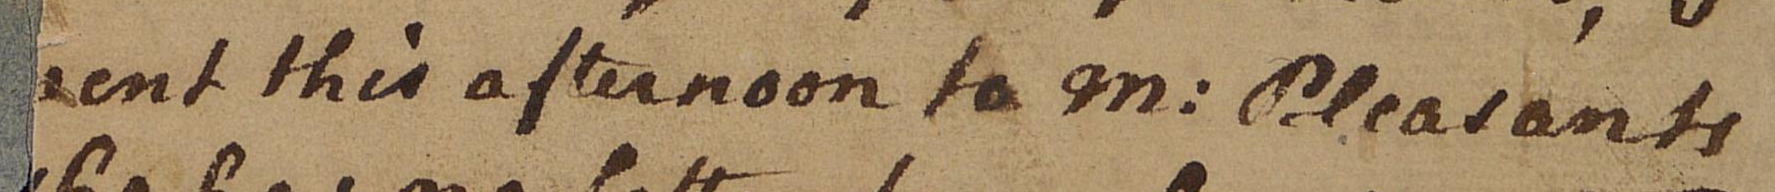went this afternoon to M: Pleasants
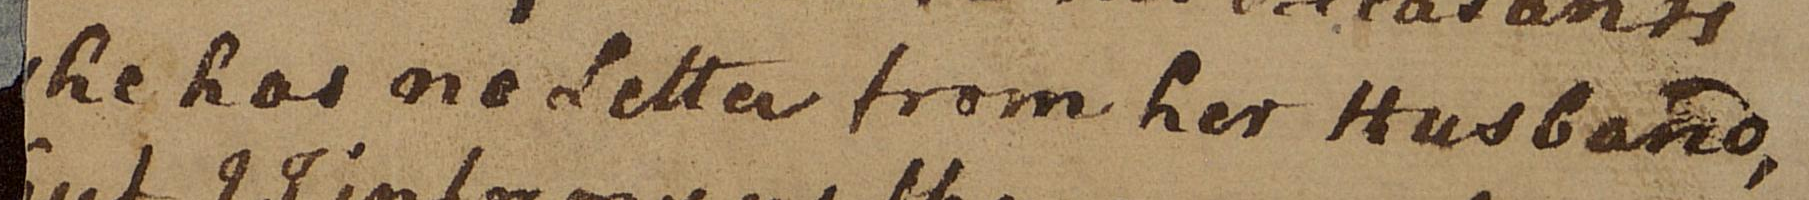she has no Letter from her Husband,
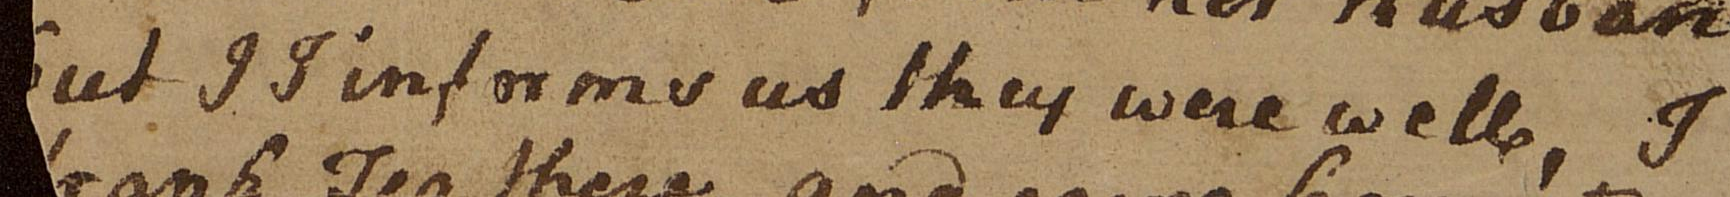but I I informs us they were well, I
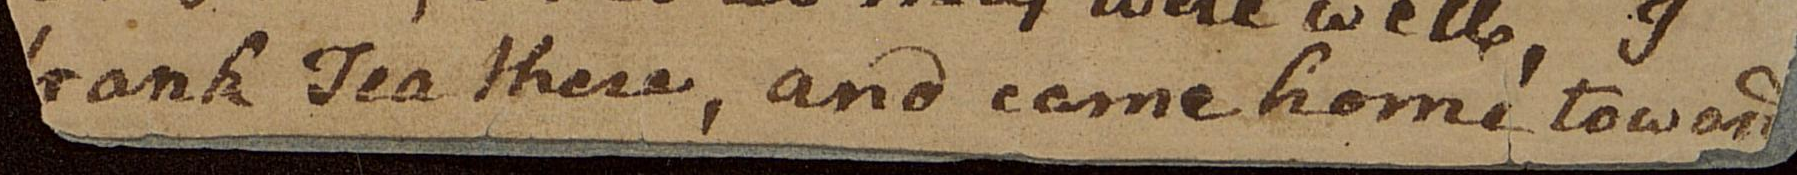drank Tea there, and came home towar[d]
